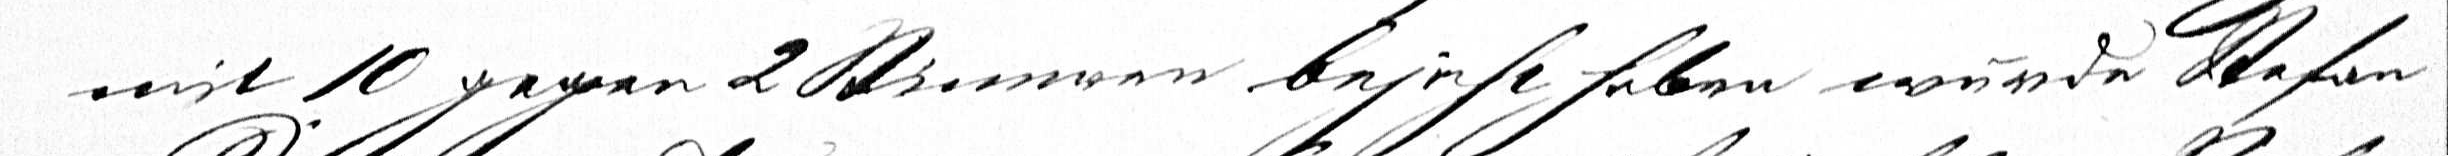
mit 10 gegen 2 Stimmen bejaht heben wurde Stefan
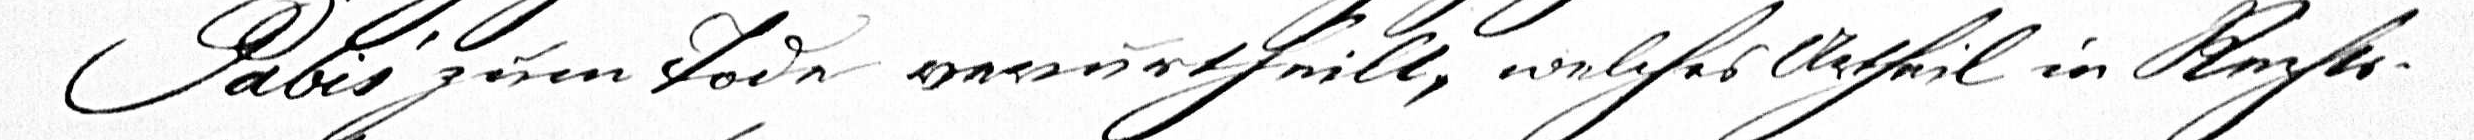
Pabiś zum Tode verurtheilt, welches Urtheil in Rechts¬
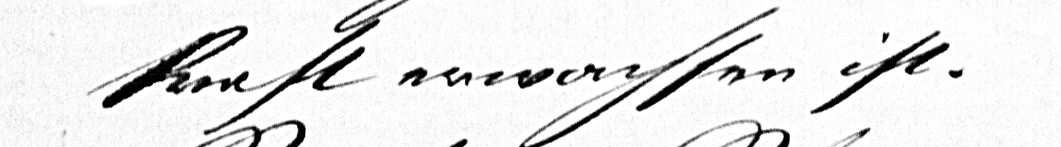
knecht erwachten ist.
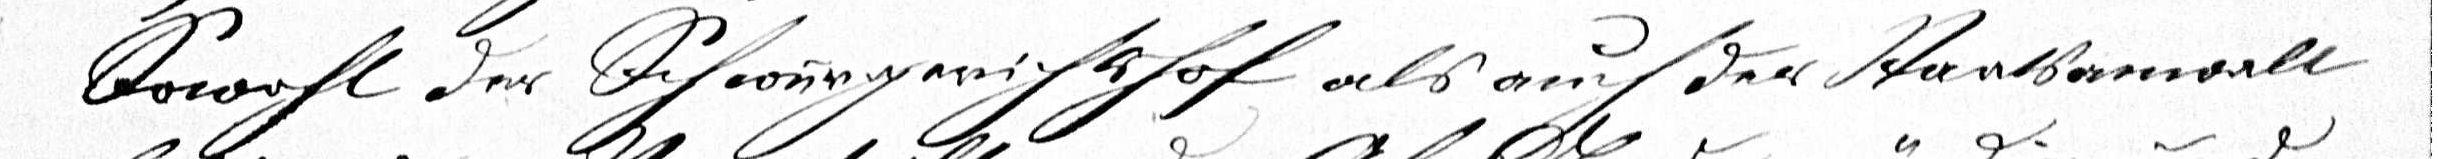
Sowohl der Schwurgerichtshof als auch der Staatsanwalt
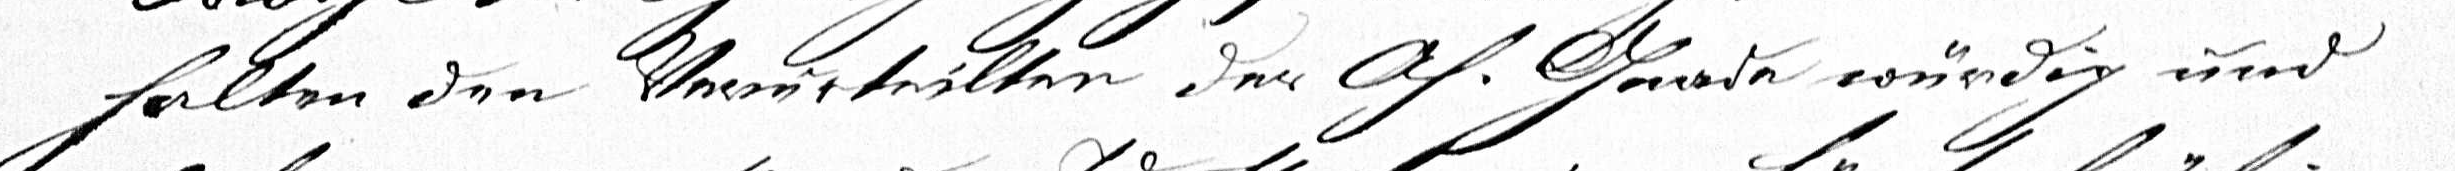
halten den Verurteilten der Ah. Gnade würdig und
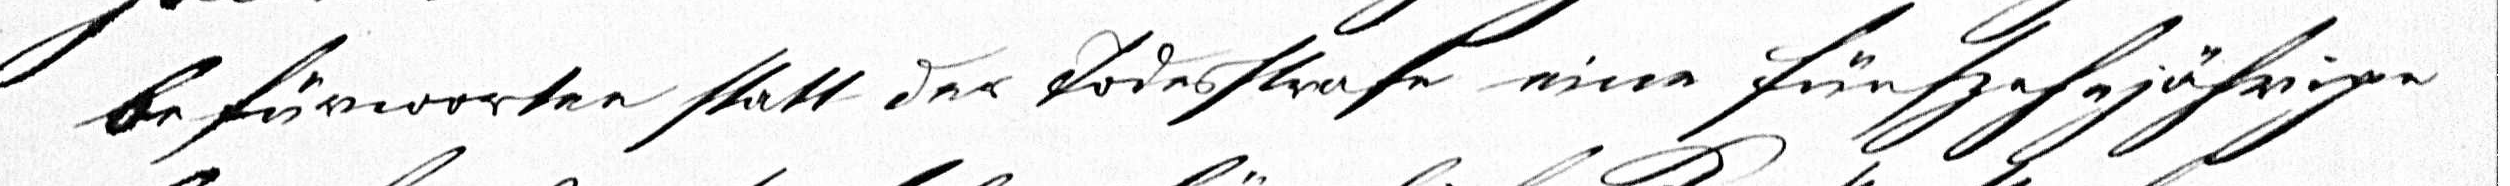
befürworten statt der Todesstrafe eine fünfzehejährige
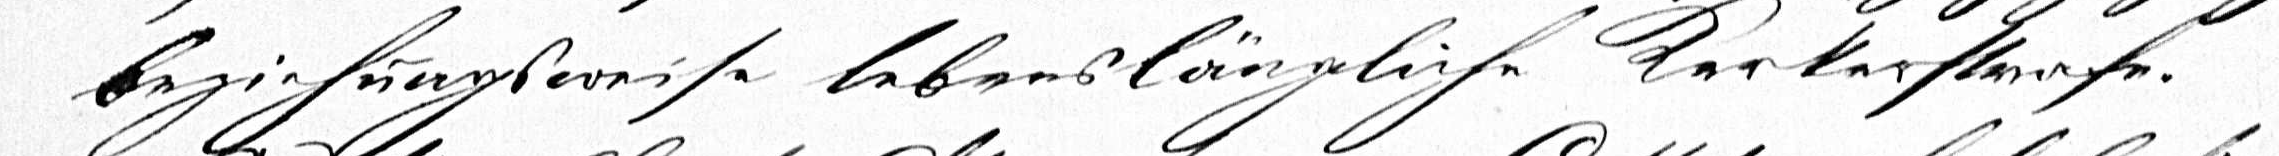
Beziehungsweise lebenslängliche Kerkerstrafe.
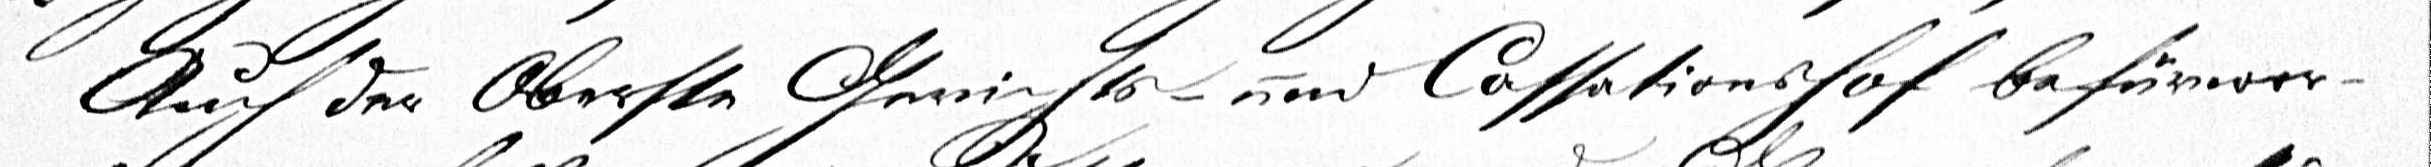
Auch der Oberste Gerichts- und Cassationshof befürwor¬
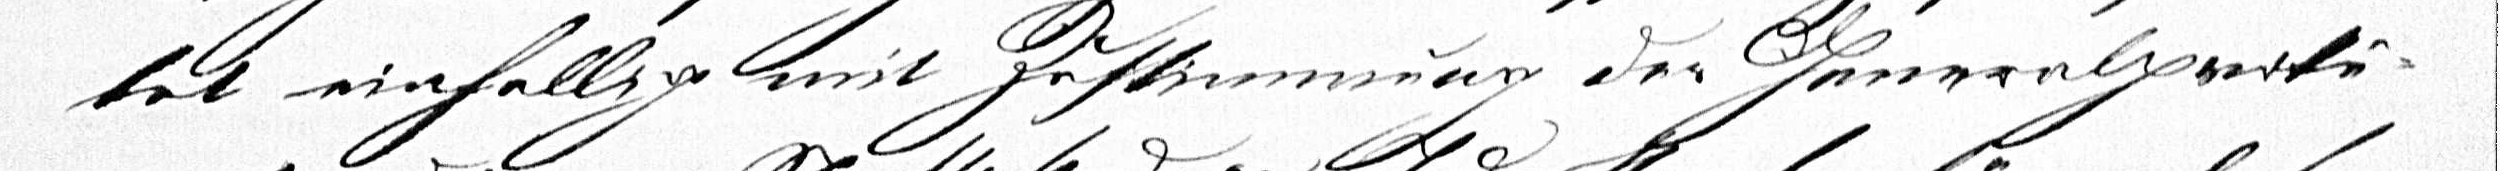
tet einhellig mit Zustimmung der Generalproku¬
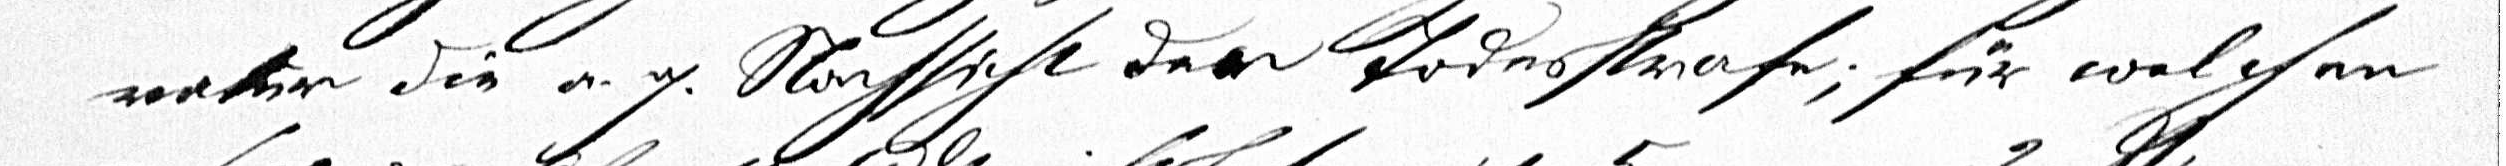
ratur die a. g. Nachsicht der Todesstrafe; für welchen
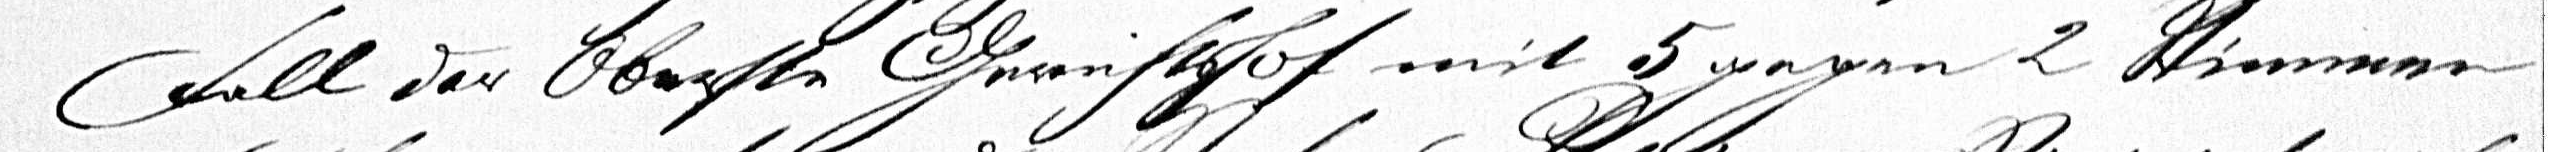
Fall der Oberste Gerichtshof mit 5 gegen 2 Stimmen
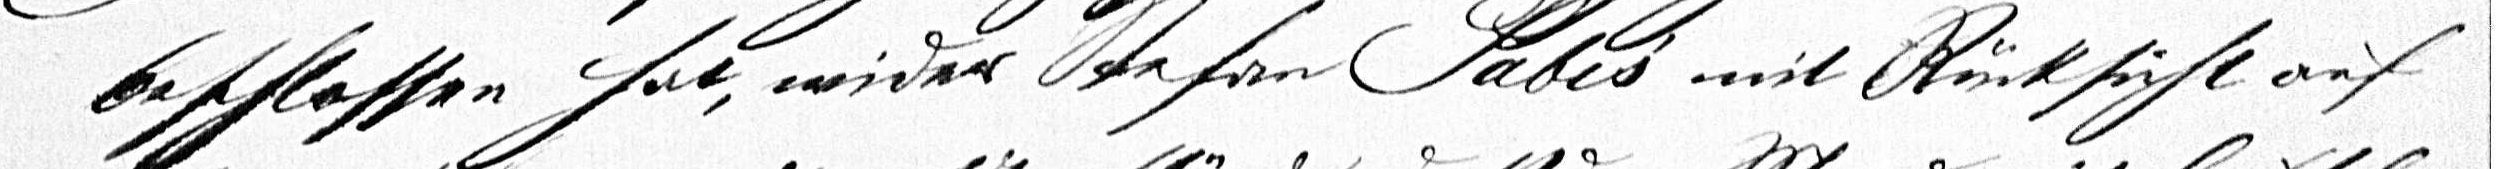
beschlossen hat, wider Stefan Pabiś mit Rücksicht auf
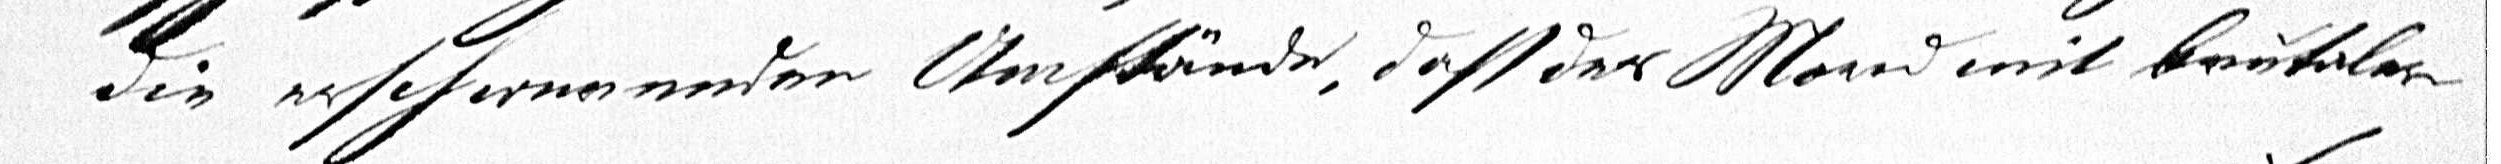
die erschwerenden Umstände, daß der Mord mit brutalen
